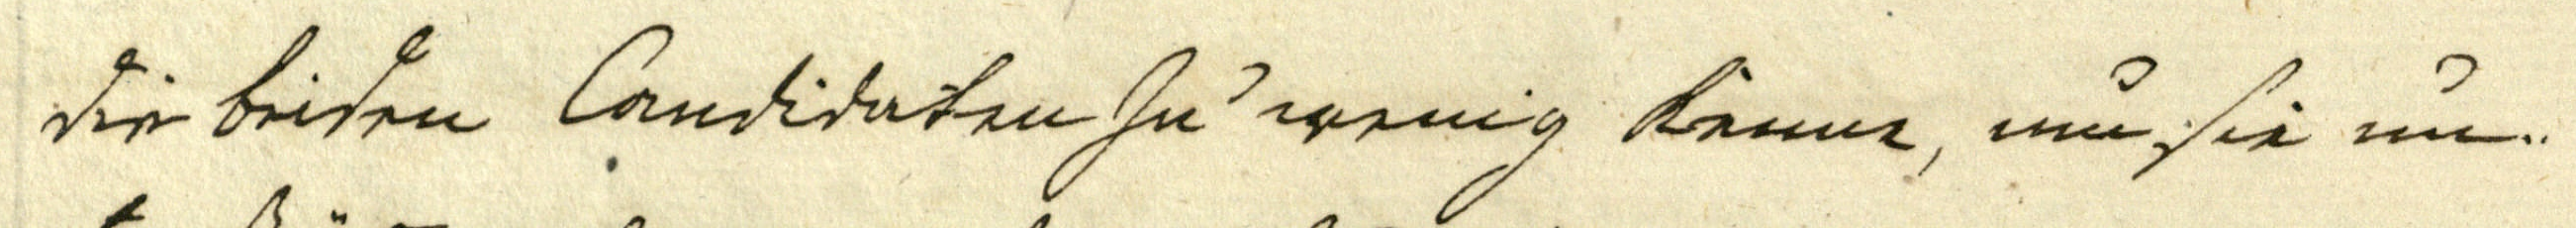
die beiden Candidaten zu wenig kenne, um sie un¬
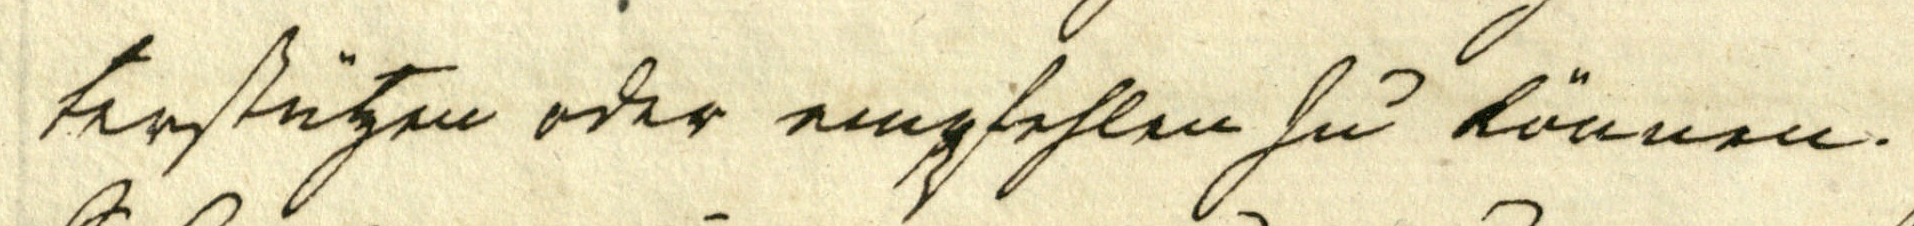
terstützen oder empfehlen zu können.
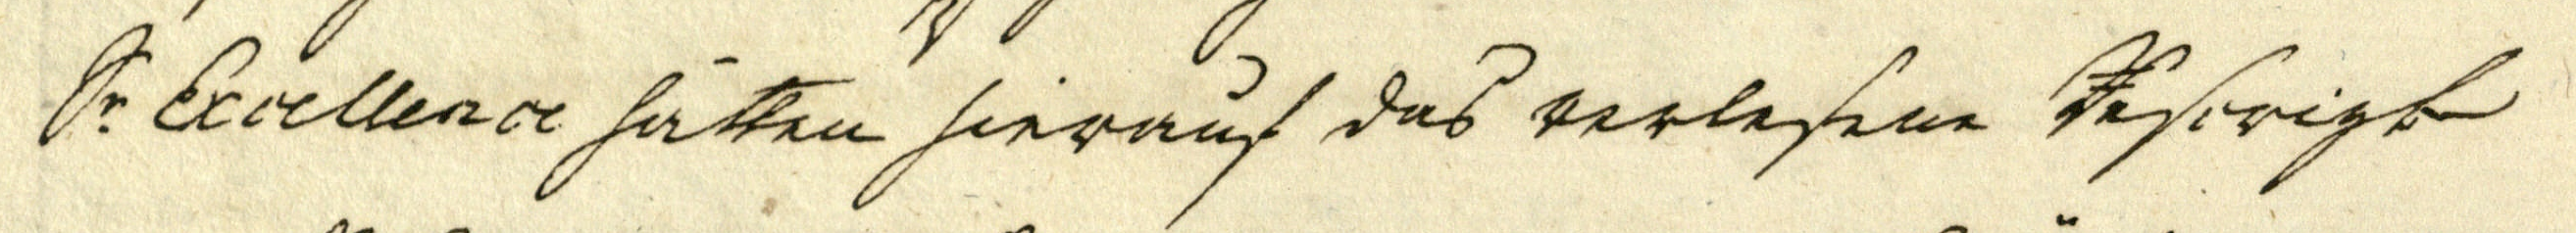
Sr. Excellence hätten hierauf das verlesene Rescript
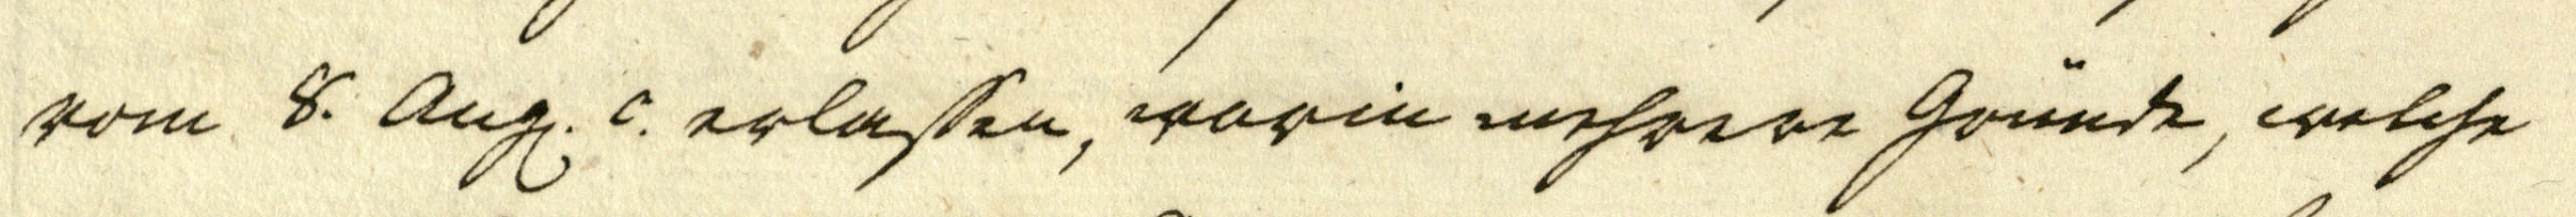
vom 8. Aug. c. erlassen, worin mehrere Gründe, welche
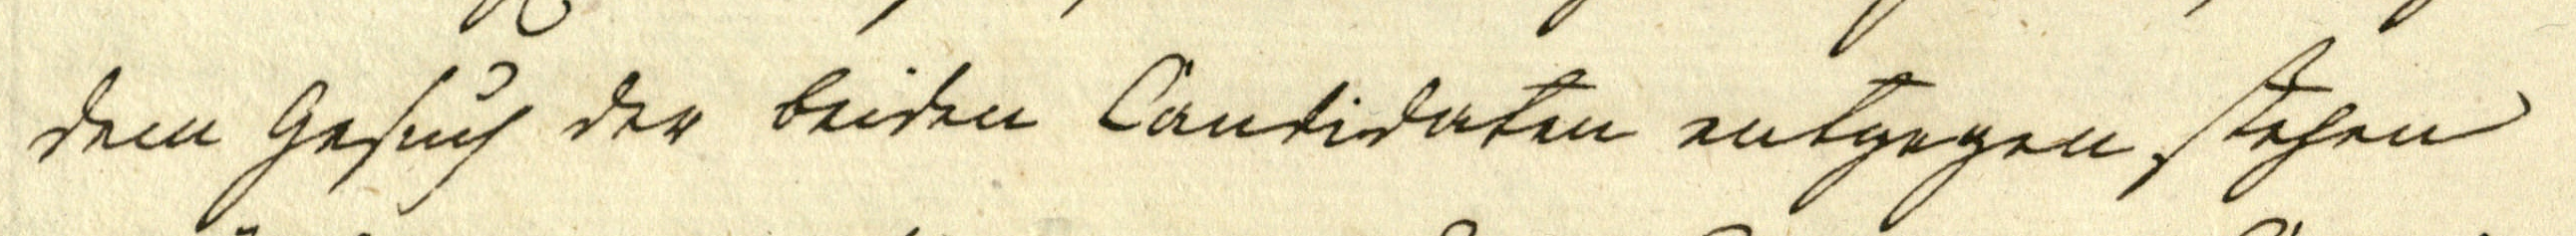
dem Gesuch der beiden Candidaten entgegen stehen
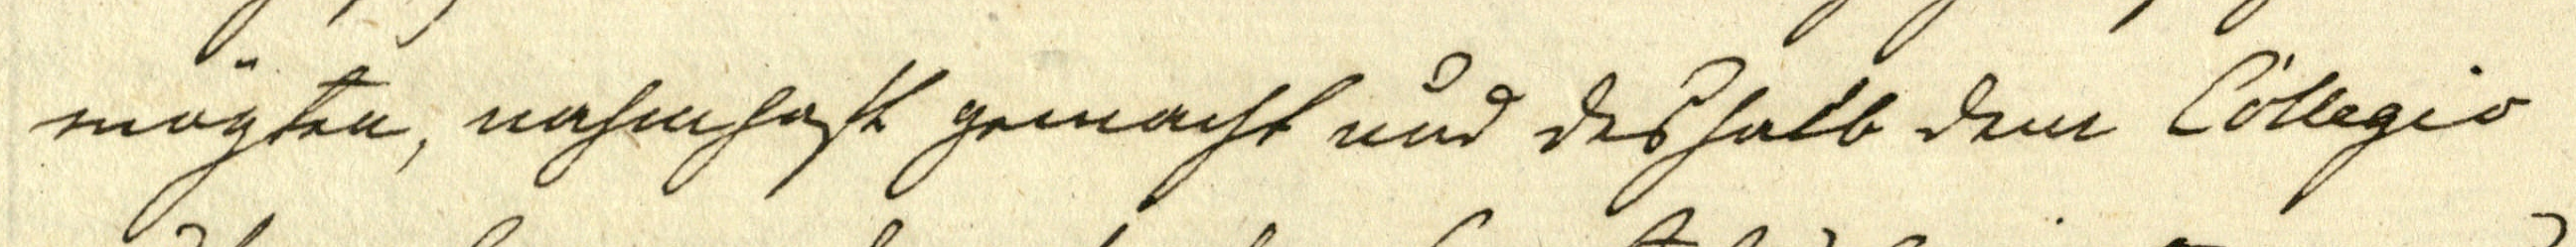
mögten, nahmhaft gemacht und deshalb dem Collegio
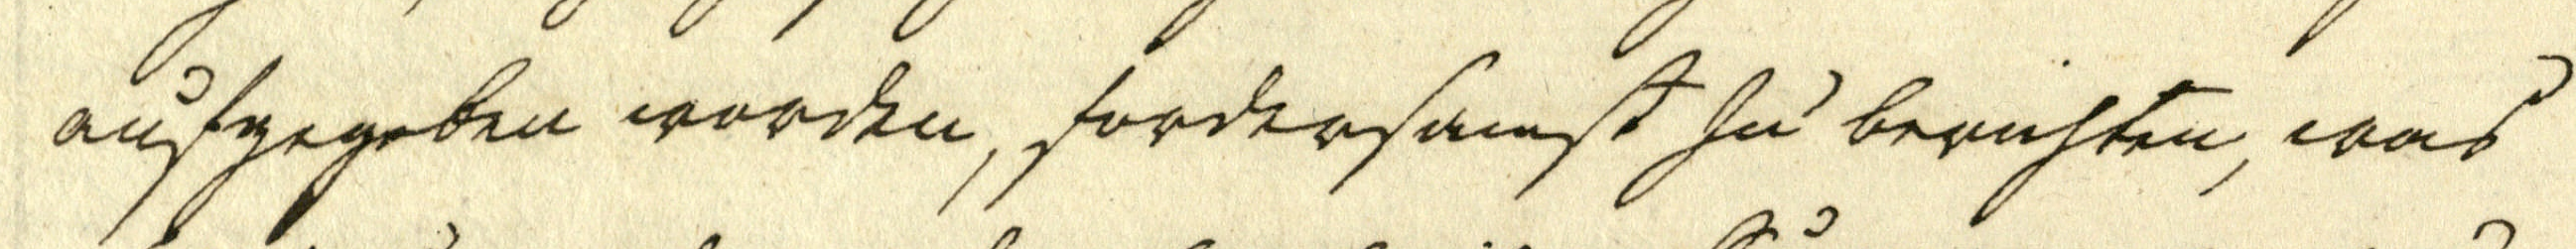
aufgegeben worden, fordersamst zu berichten, was
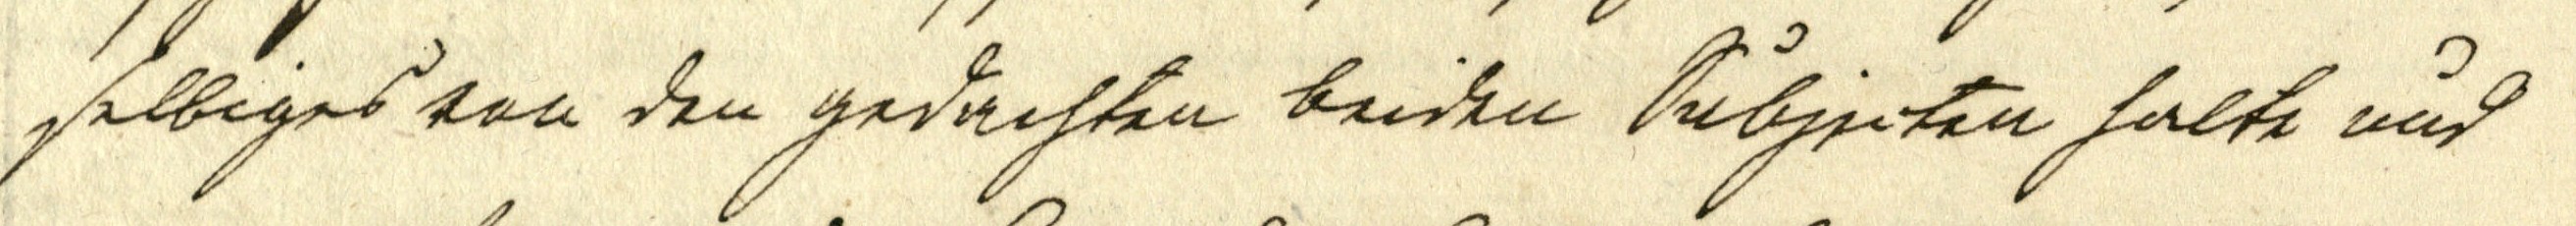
selbiges von den gedachten beiden Subjecten halte und
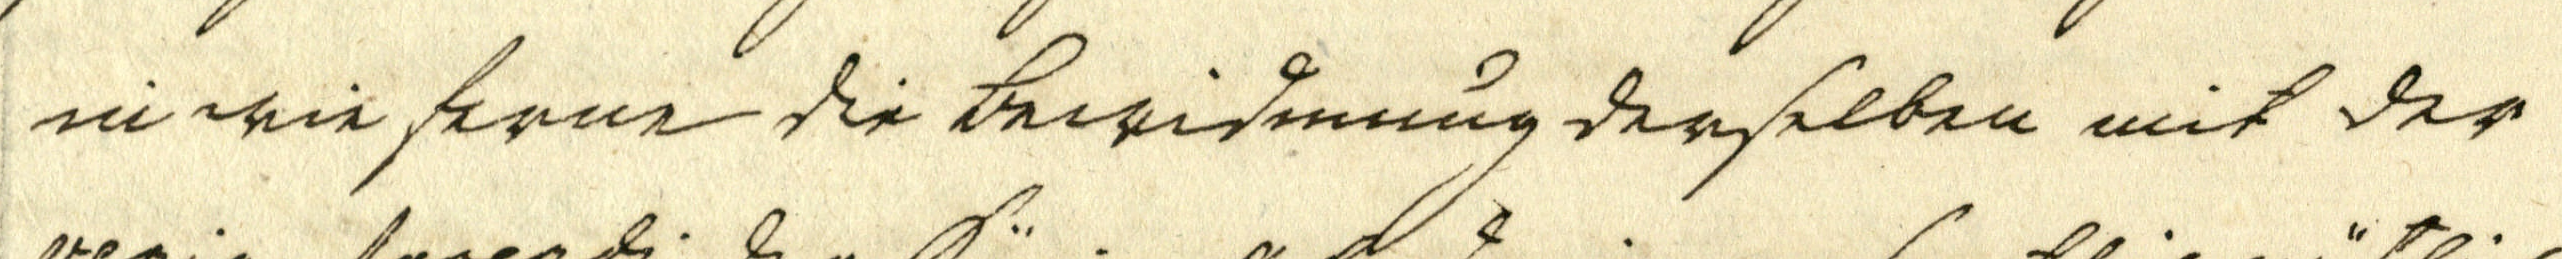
in wie ferne die Bewidmung derselben mit der
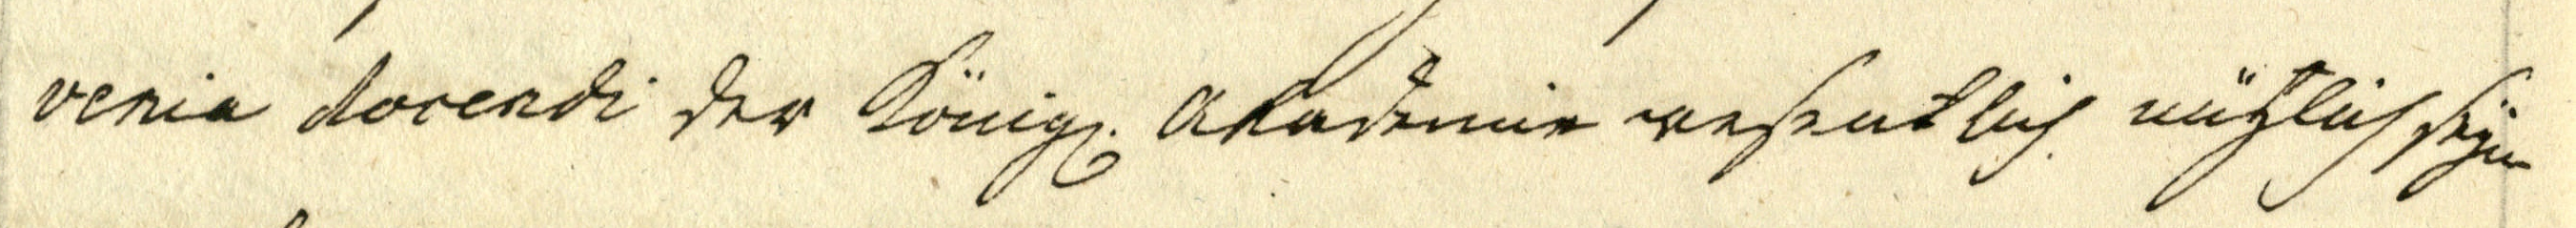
venia docendi der Königl. Akademie wesentlich nützlich seÿn
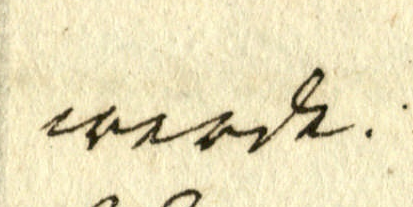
werde.
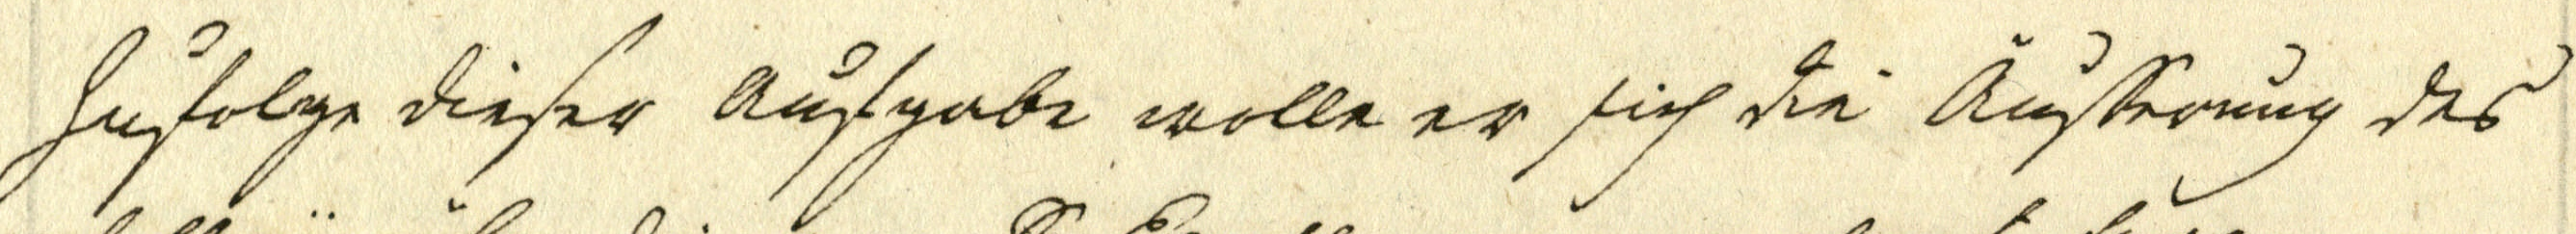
Zufolge dieser Aufgabe wolle er sich die Äusserung des
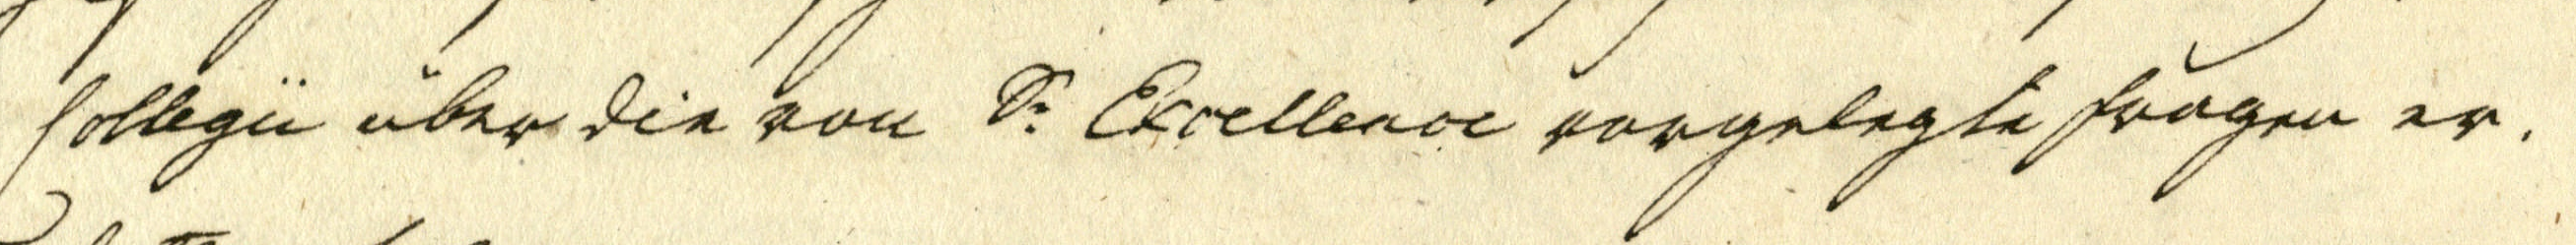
Collegi über die von Sr. Excellence vorgelegte Fragen er¬
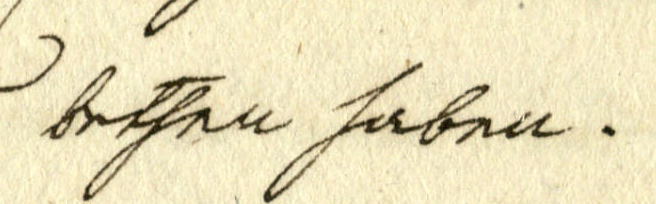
bethen haben.
